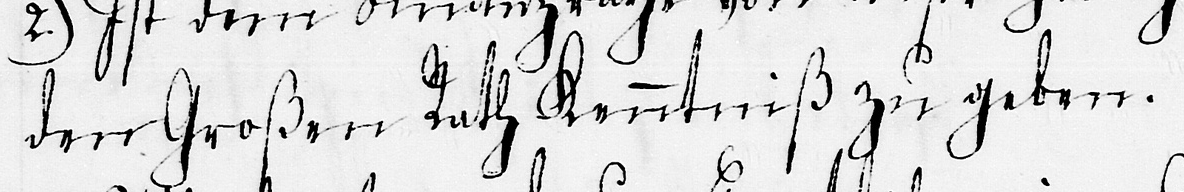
den Großen Rath Kenntniß zu geben.
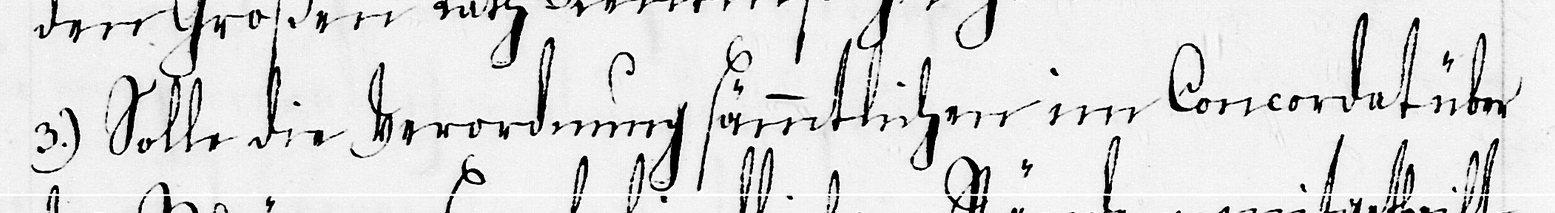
3.) Solle die Verordnung sämmtlichen im Concordat über
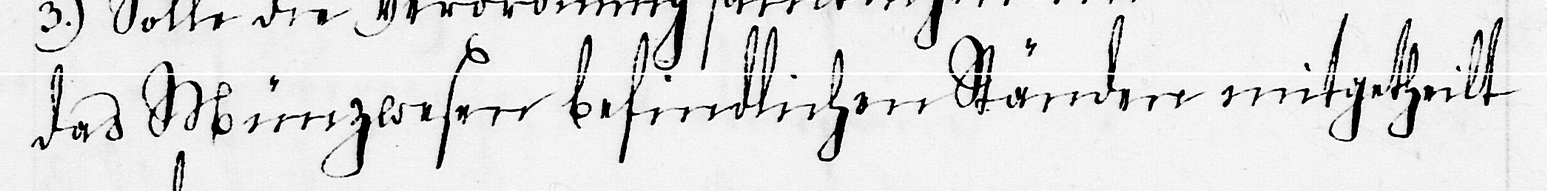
das Münzwesen befindlichen Ständen mitgetheilt
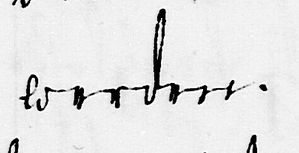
werden.
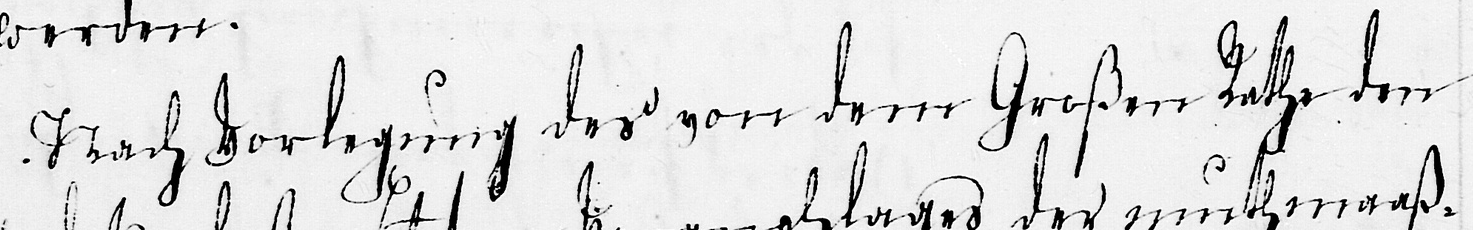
Nach Vorlegung des von dem Großen Rathe den
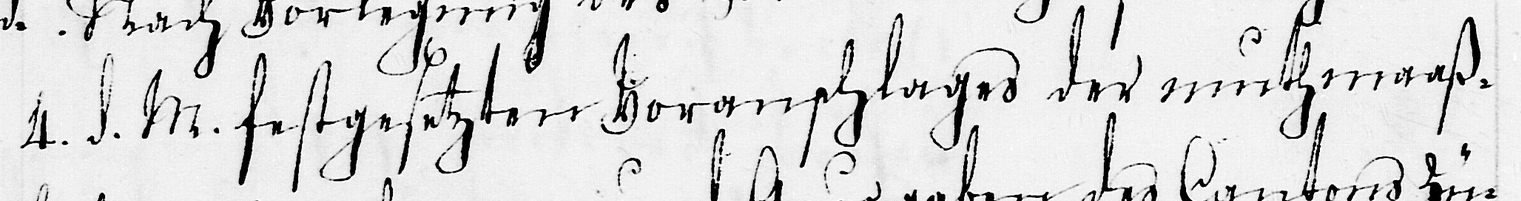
4. d. M. festgesetzten Voranschlages der muthmaaß¬
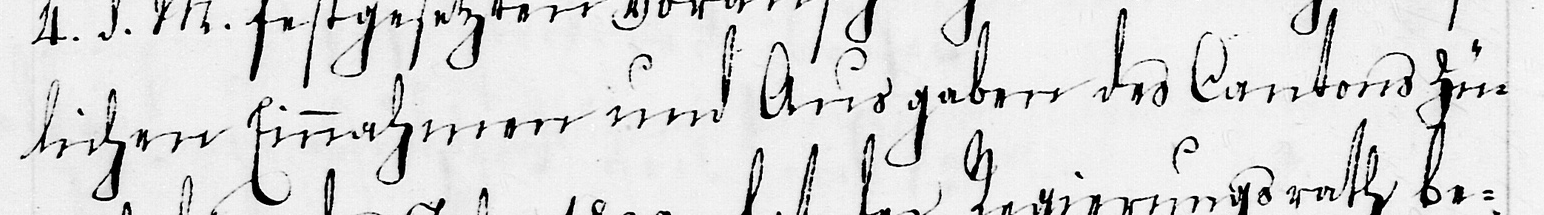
lichen Einnahmen und Ausgaben des Cantons Zü¬
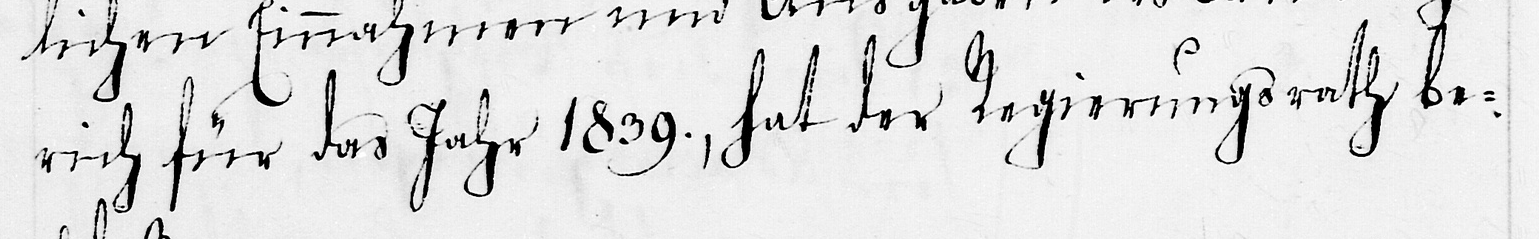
rich für das Jahr 1839., hat der Regierungsrath be¬
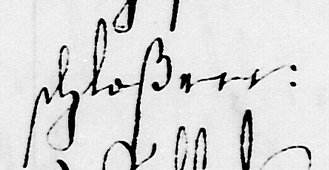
schloßen:
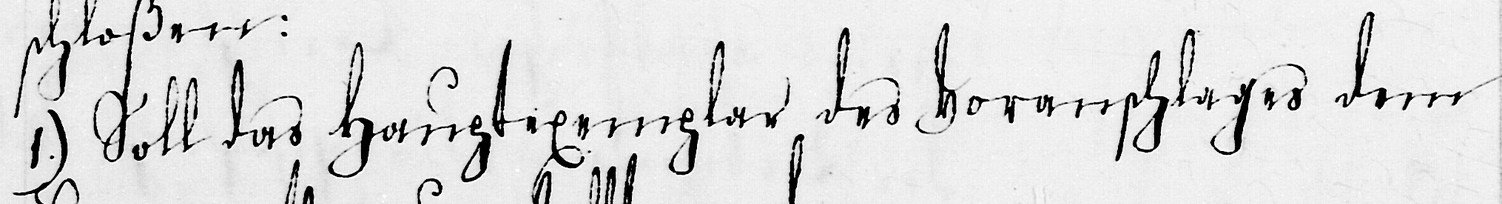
1.) Soll das Hauptexemplar des Voranschlages dem
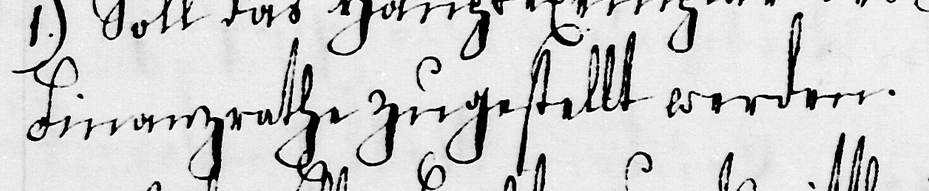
Finanzrathe zugestellt werden.
